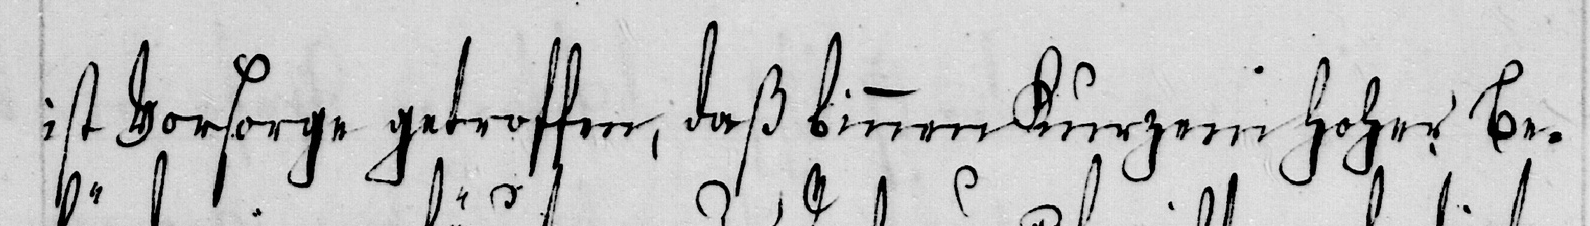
ist Vorsorge getroffen, daß binnen Kurzem Hoher Be¬
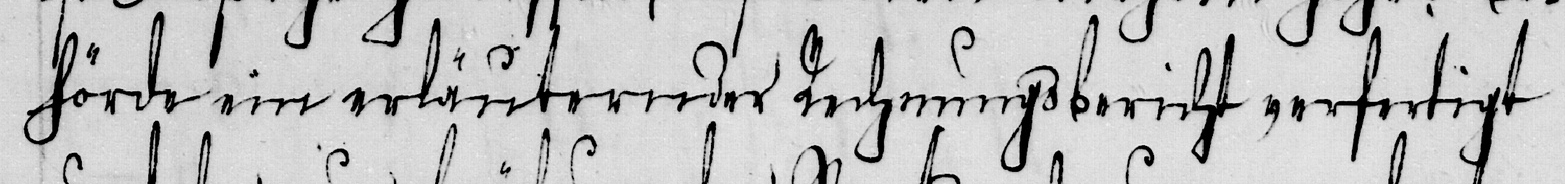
hörde ein erläuternder Rechnungsbericht verfertigt
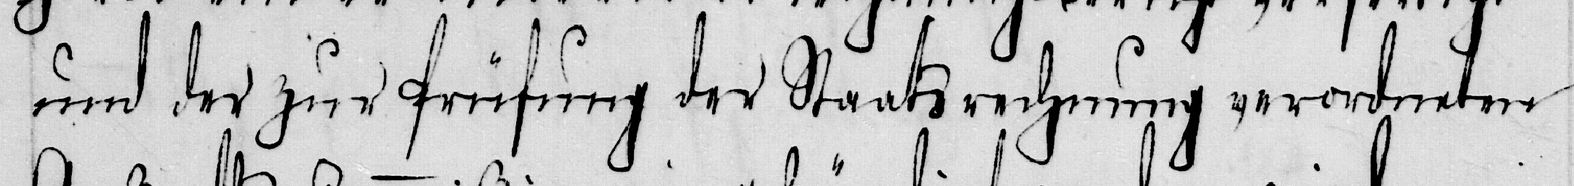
und der zur Prüfung der Staatsrechnung verordneten
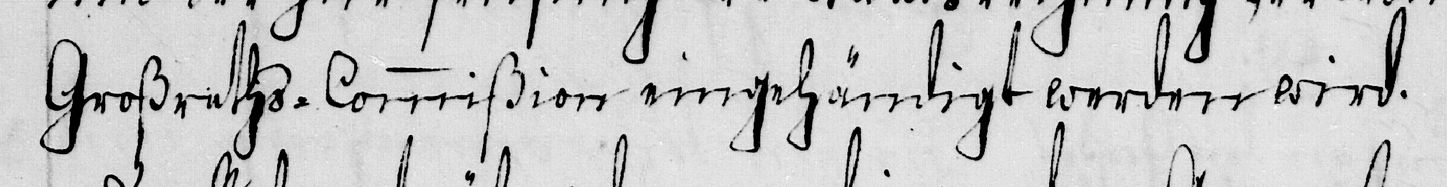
Großraths-Commißion eingehändigt werden wird.
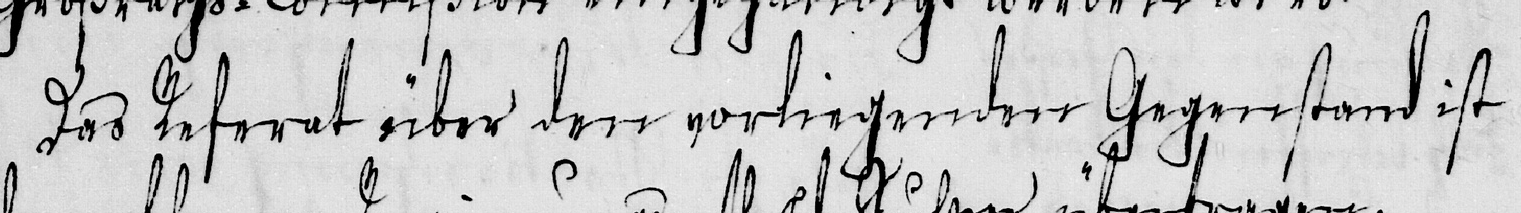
Das Referat über den vorliegenden Gegenstand ist
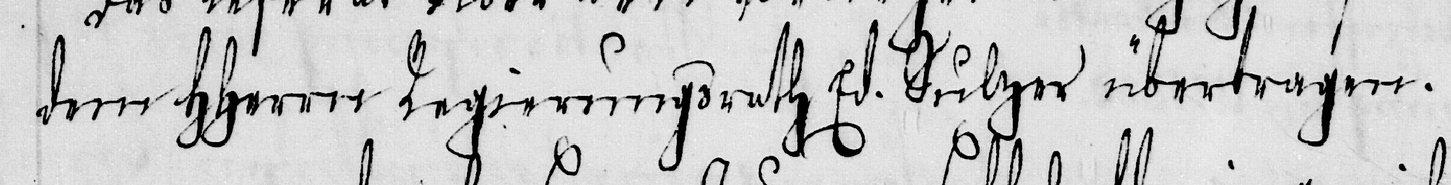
dem HHerrn Regierungsrath Ed. Sulzer übertragen.
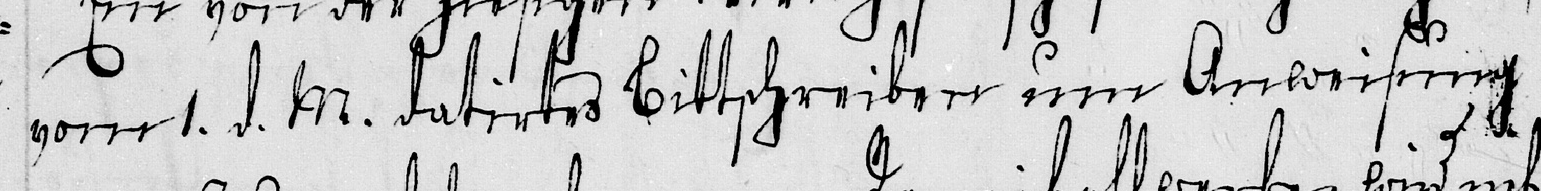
vom 1. d. M. datirtes Bittschreiben um Anweisung
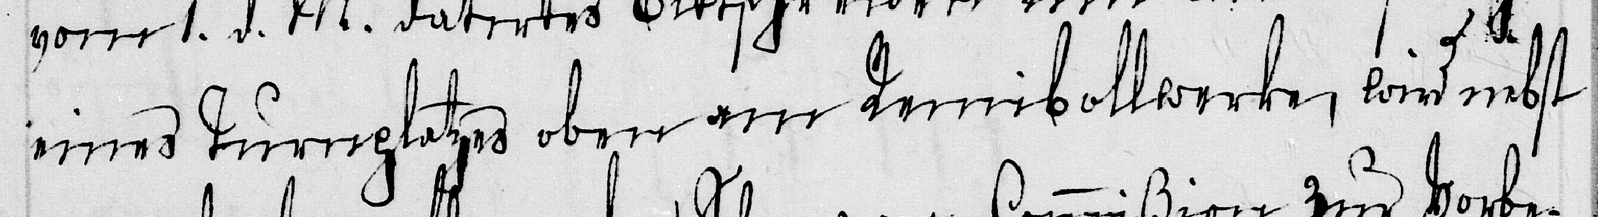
eines Turnplatzes oben am Remibollwerke, wird nebst
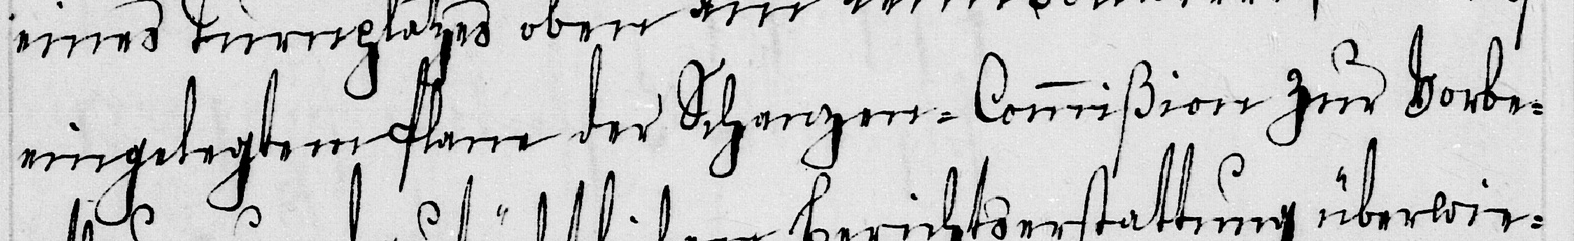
eingelegtem Plane der Schanzen-Commißion zur Vorbe¬
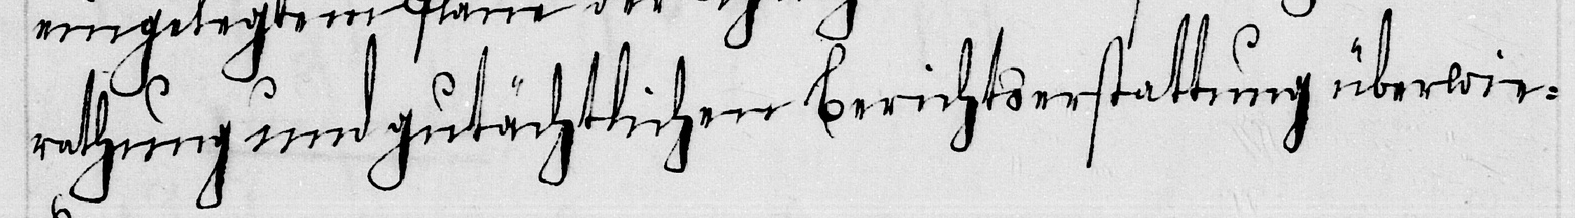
rathung und gutächtlichen Berichtserstattung überwie¬
